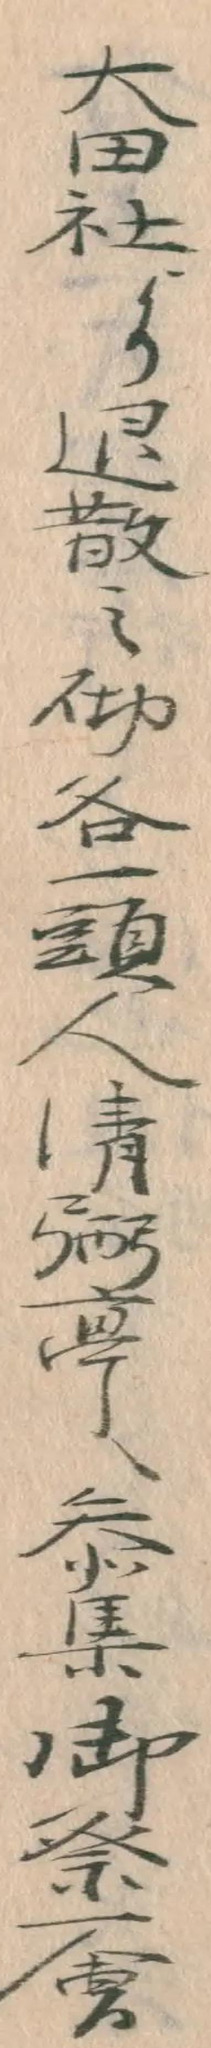一大田社より退散之砌各一頭人清弼亭へ参集御祭一會
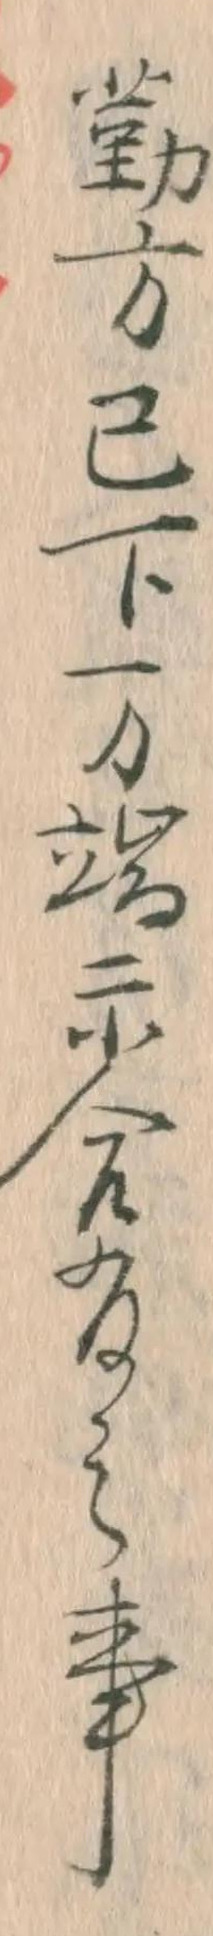勤方已下万端示合有之事
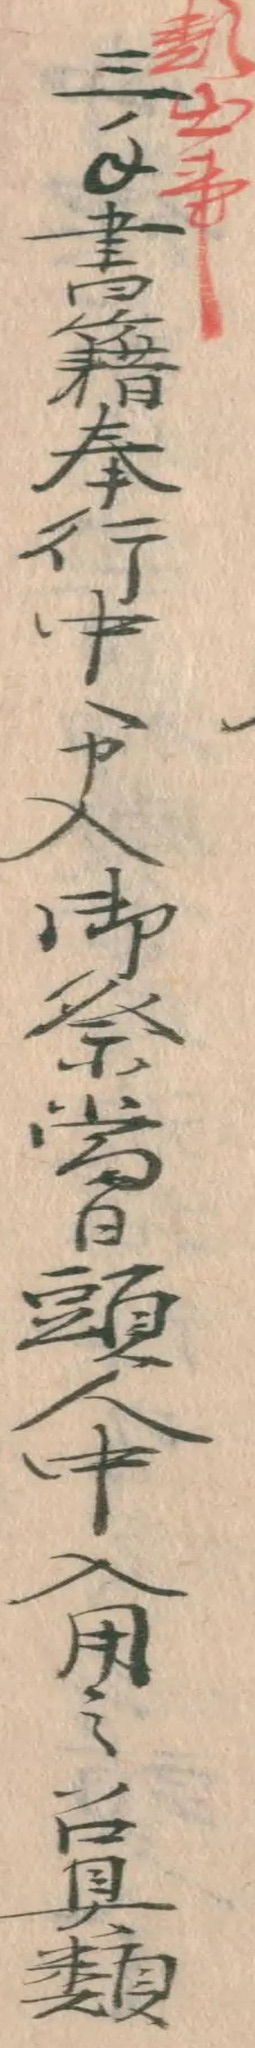一三手書籍奉行中へ申入御祭當日頭人中入用之召具類
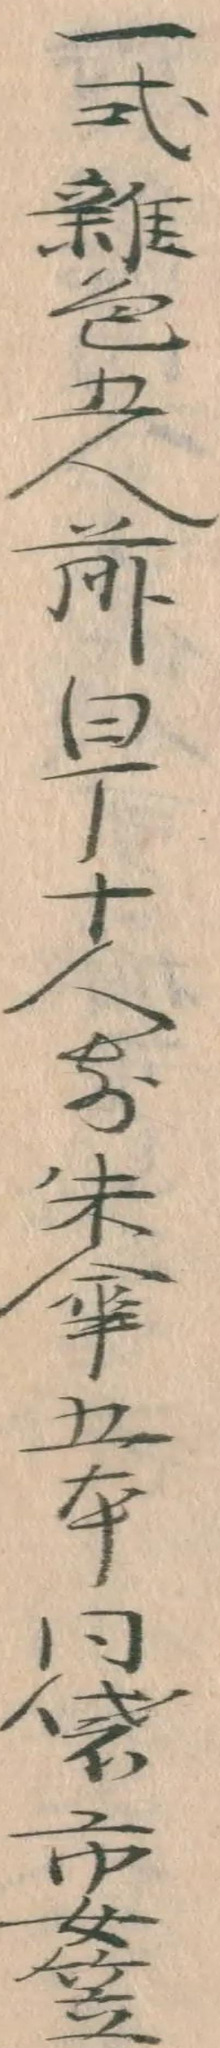一式雑色五人前白丁十人前朱傘五本同袋市女笠
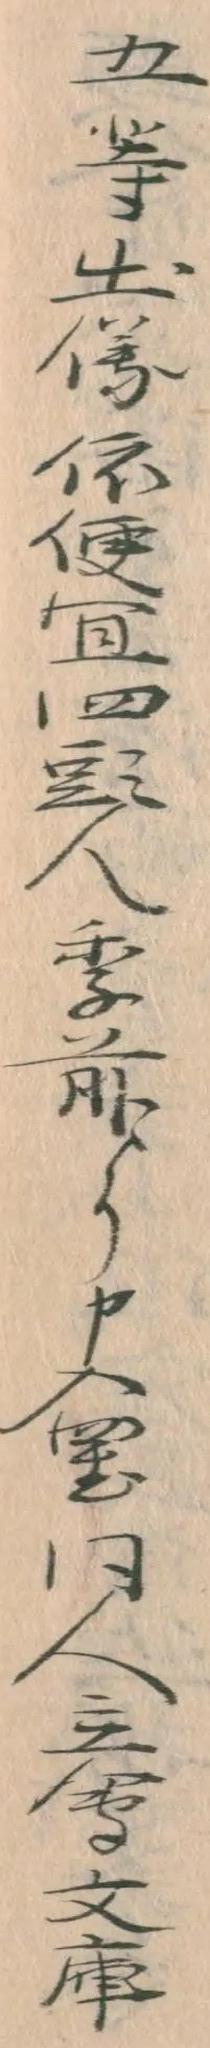五等出儀依便宜四頭人季前より申入男同人立會文庫
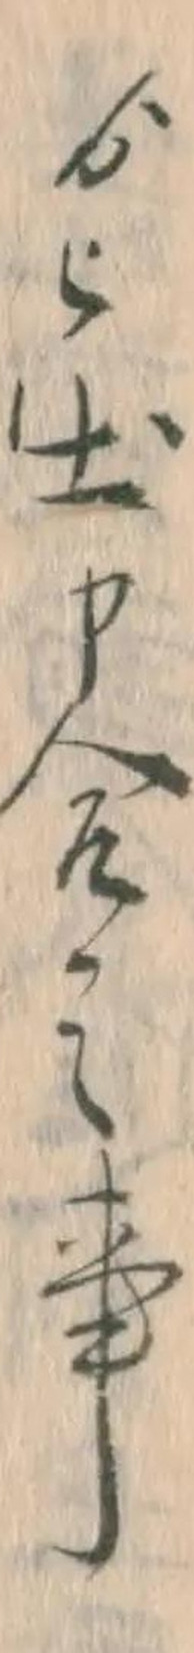ゟ被出申合之事
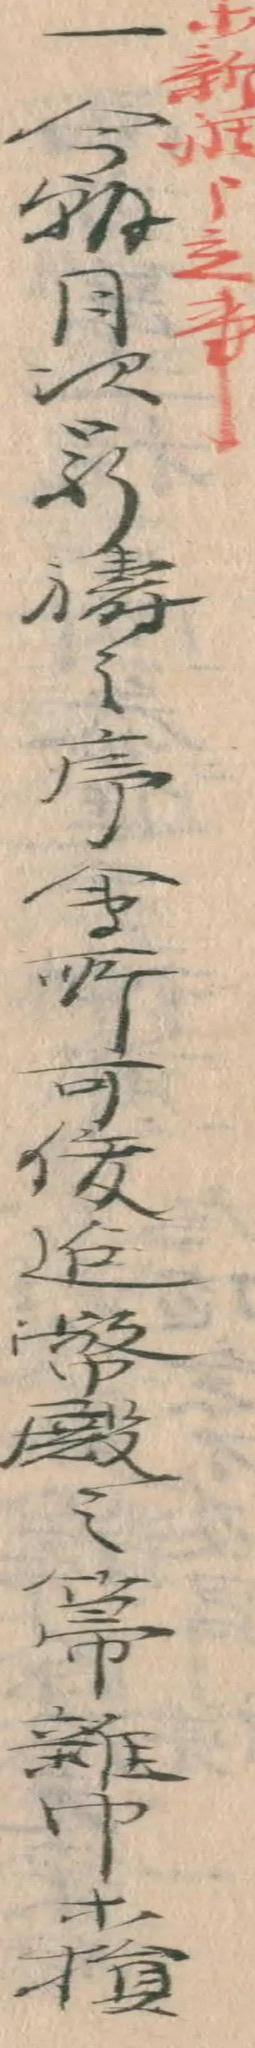一今朝月次御祈祷之序會所可俊迄幣殿之箒雑巾等損
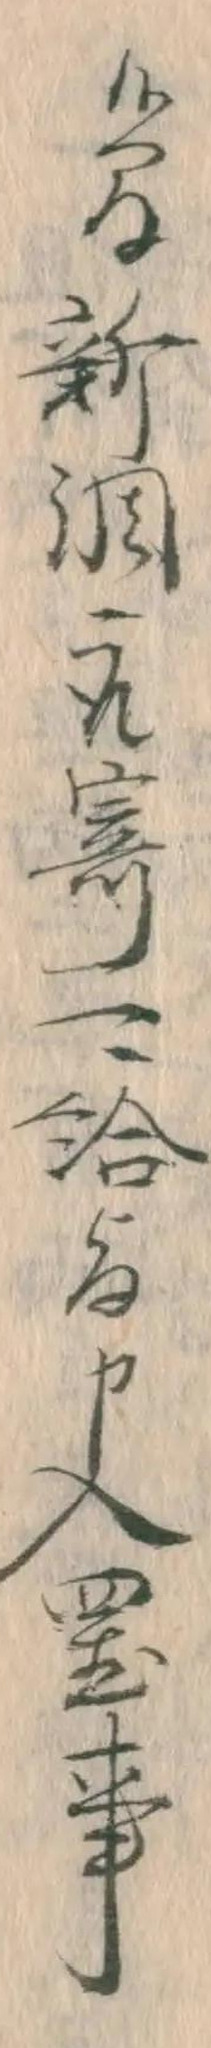候間新調取寄可給旨申入置事
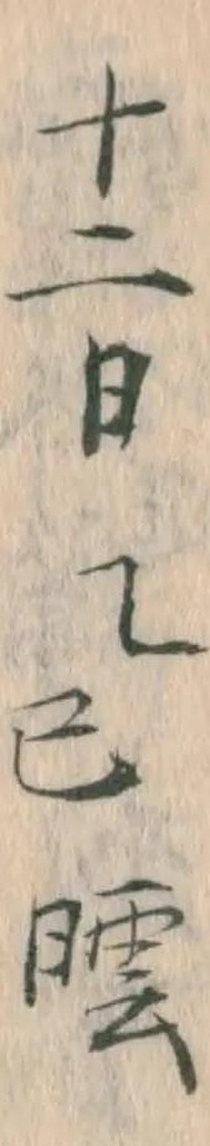十二日乙巳曇
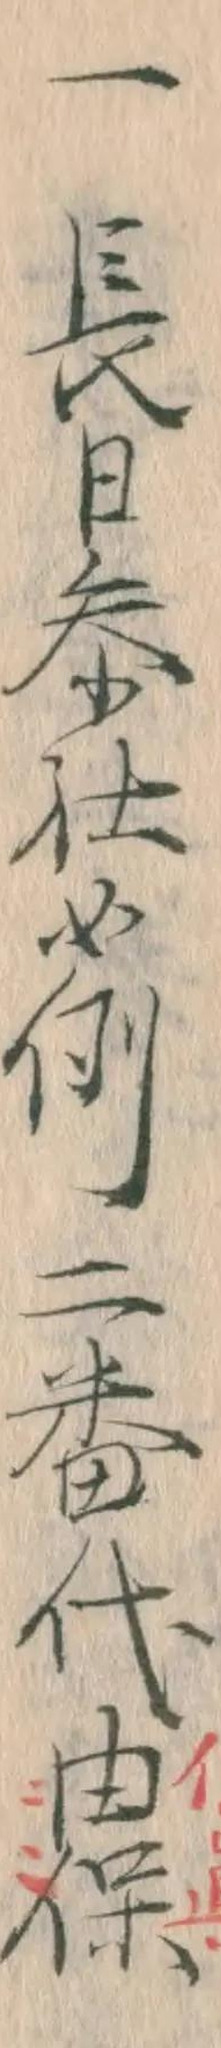一長日参社如例二番代由保
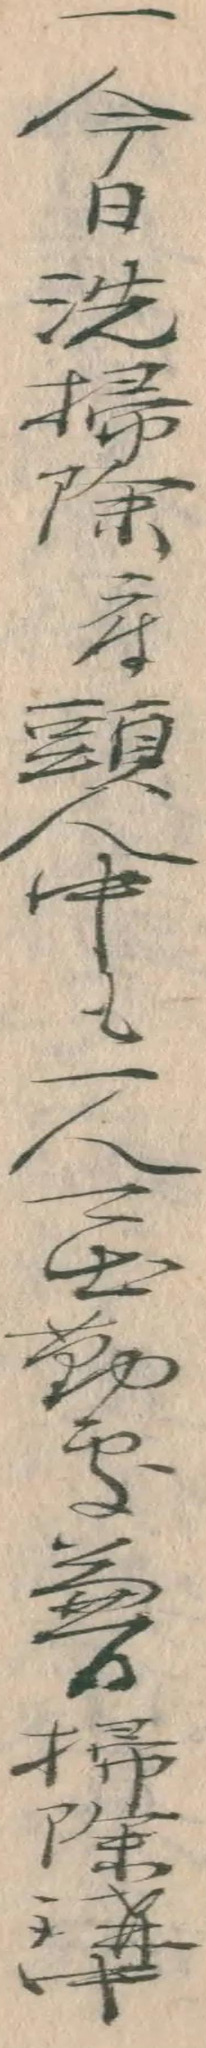一今日洗掃除ニ付頭人中も一人可出勤處兼日掃除講中
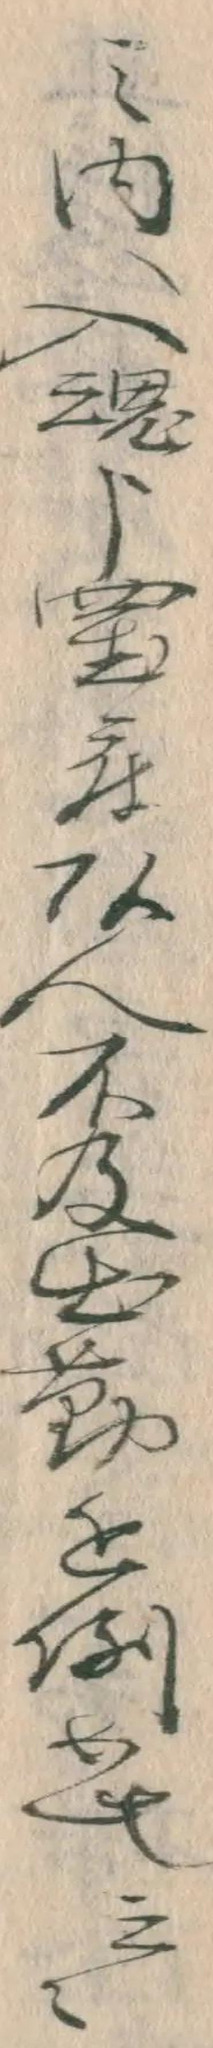之内へ入魂申置ニ付頭人不及出勤近例如此云々
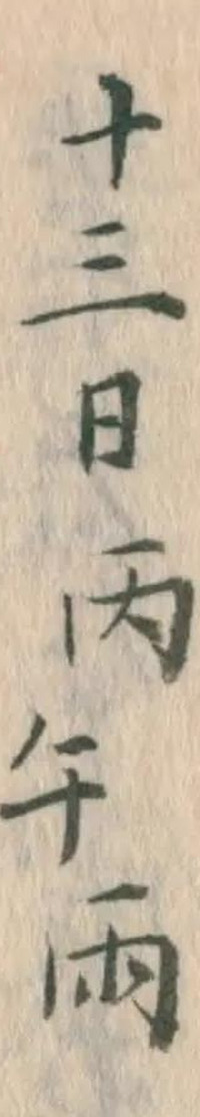十三日丙午雨
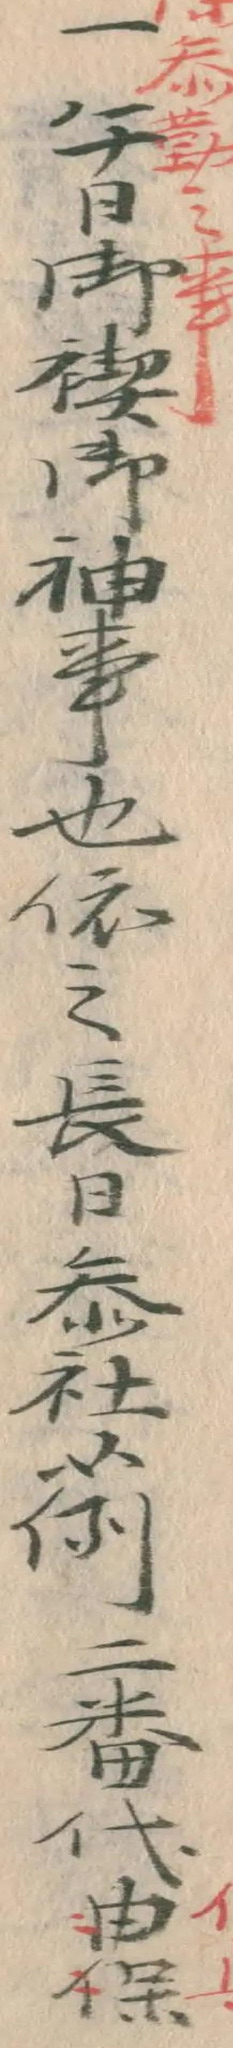一午日御禊御神事也依之長日参社如例二番代由保
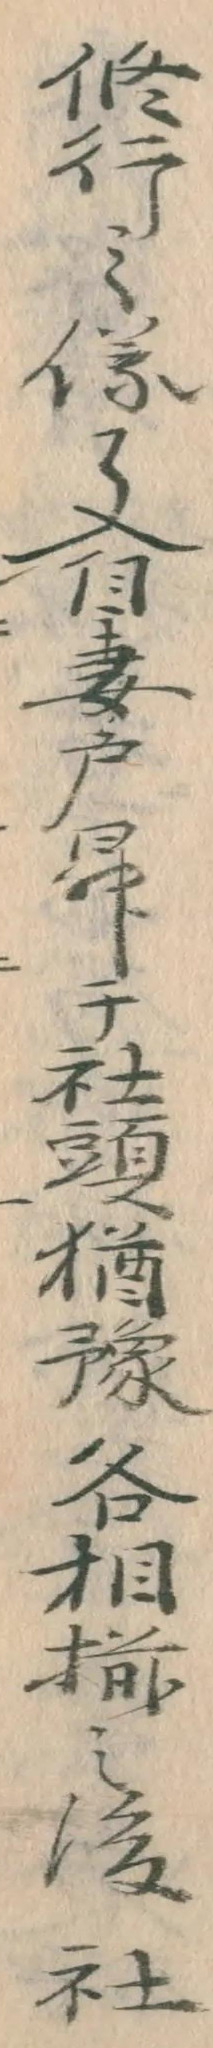修行之儀了入自妻戸昇于社頭猶豫各相揃之後社

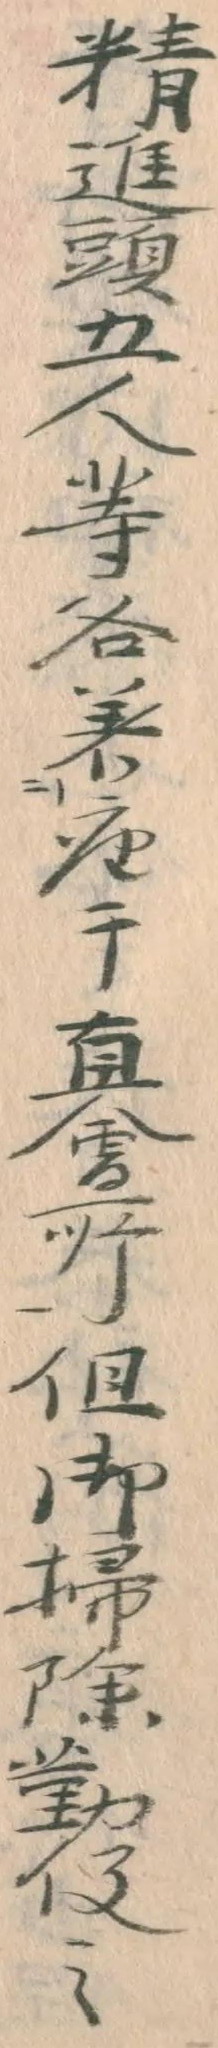精進頭五人等各着座于直會所但御掃除勤役之
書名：賀茂社記録. 第73冊
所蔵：国立国会図書館 National Diet Library, JAPAN
